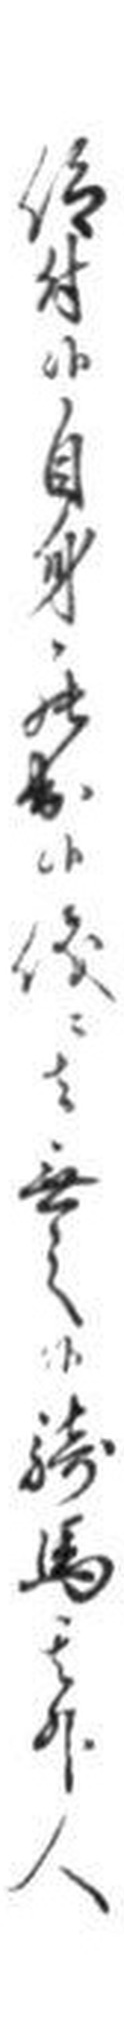仰候自身罷出候儀ニ者無之候騎馬其外人
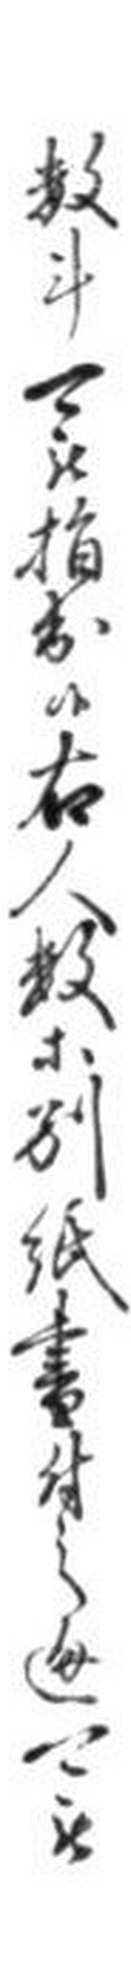数斗可被指出候右人数等別紙書付之通可被
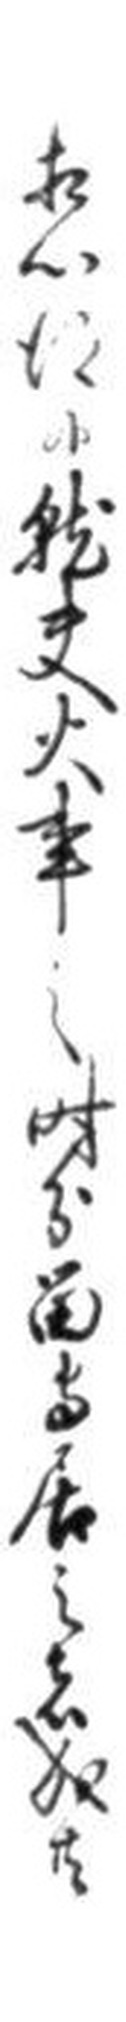相心得候就夫火事之時分留守居之者之者成共
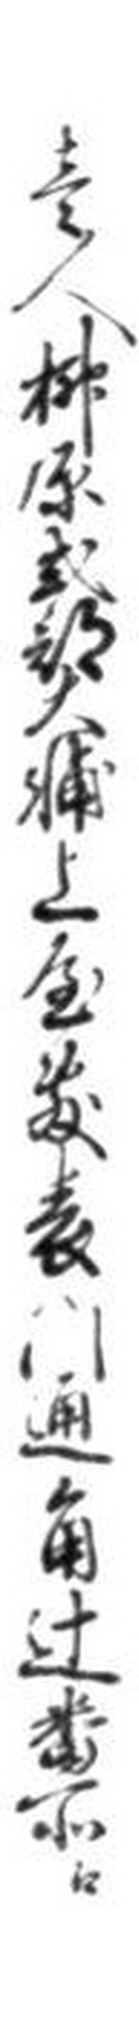壱人榊原式部大夫上屋敷表門通角辻番所江
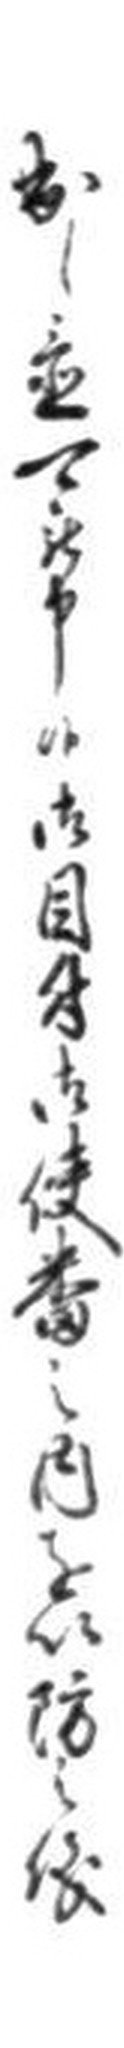出し置可被申候御目付御使番之内を以防之儀
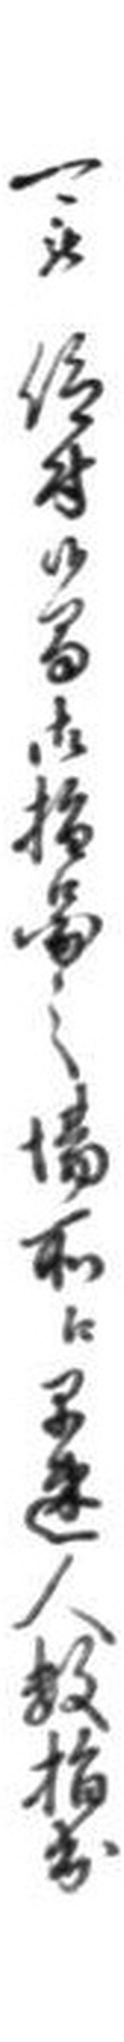可被仰付候間御指図之場所江召連人数指出
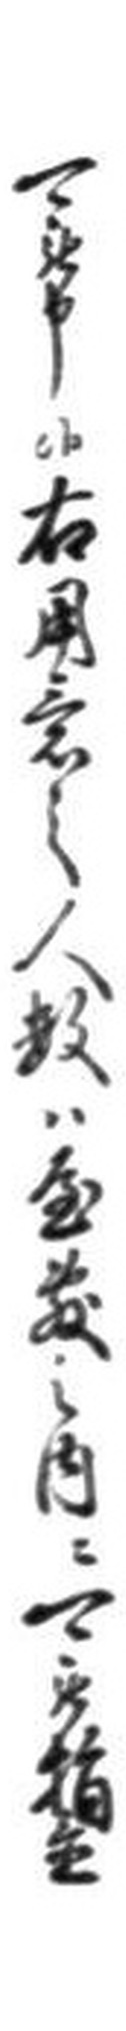可被申候右用意之人数ハ屋敷之内可被指置
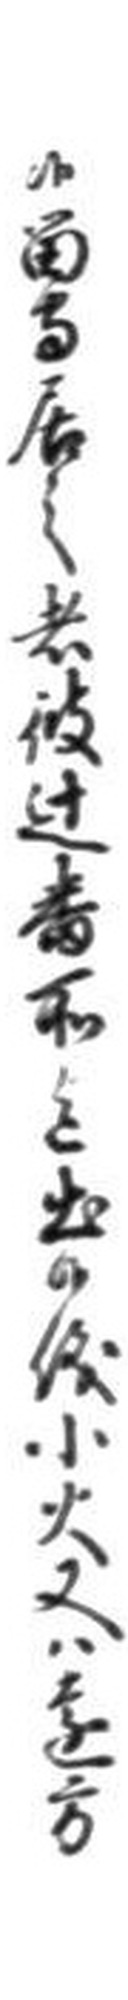候留守居之者彼辻番所迄出候儀小火又ハ遠方
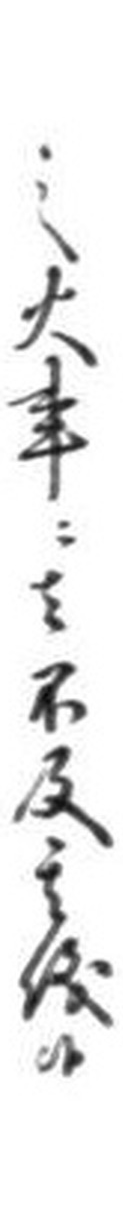之火事ニ者不及其儀候
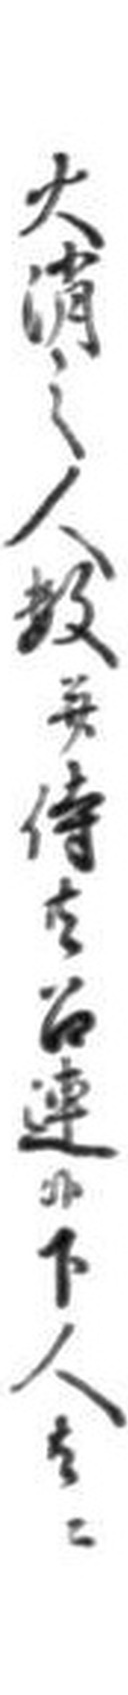火消之人数幷侍共召連候下人共ニ

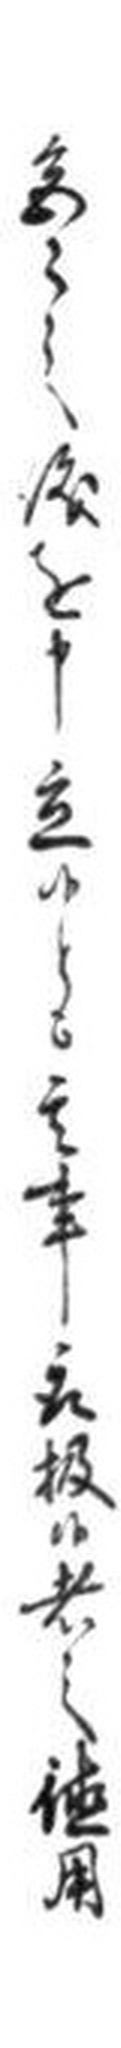宮々之儀を申立候とも其事取扱候者之徳用
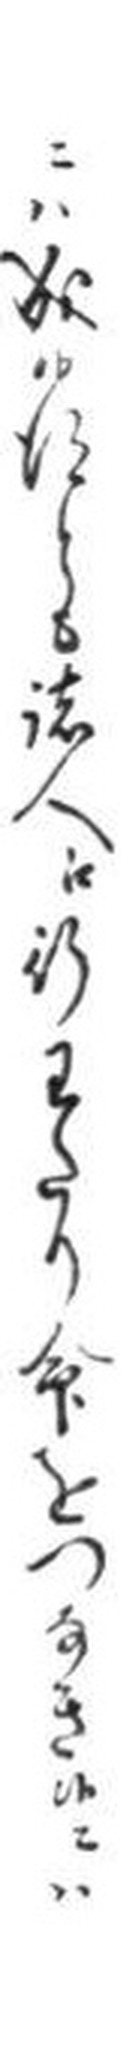ニハ成候得とも諸人江行わたり命をつなき候ニハ
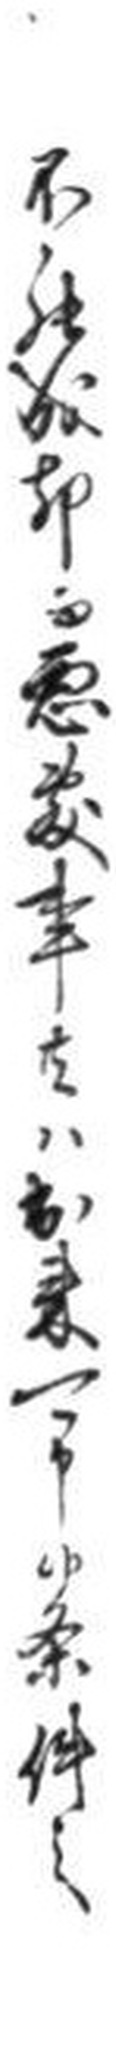不罷成却而悪敷事共ハ出来可申候条件之
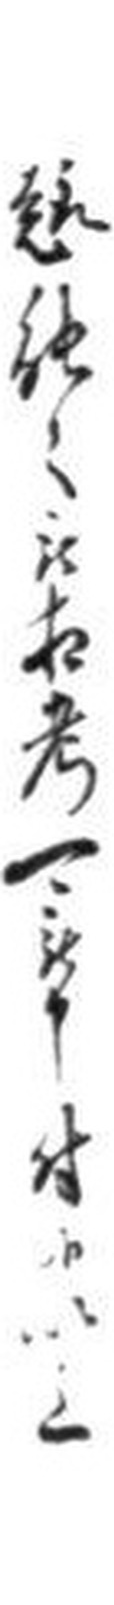趣能々被相考可被申付候以上
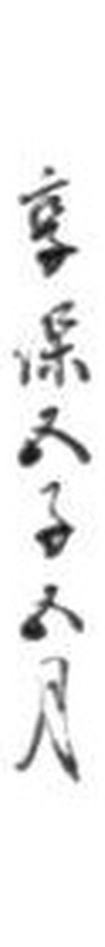享保五子五月
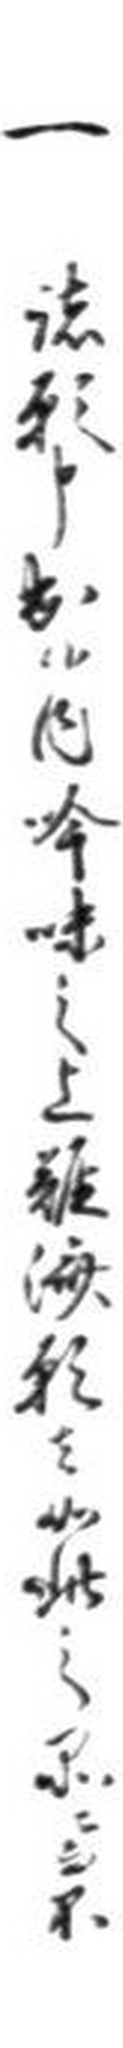一諸願申出候内吟味之上難済願者如此之品ニ而不
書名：家譜 三十四 吉邦公 従享保五年到同六年
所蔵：福井県文書館 Fukui Prefectural Archives
